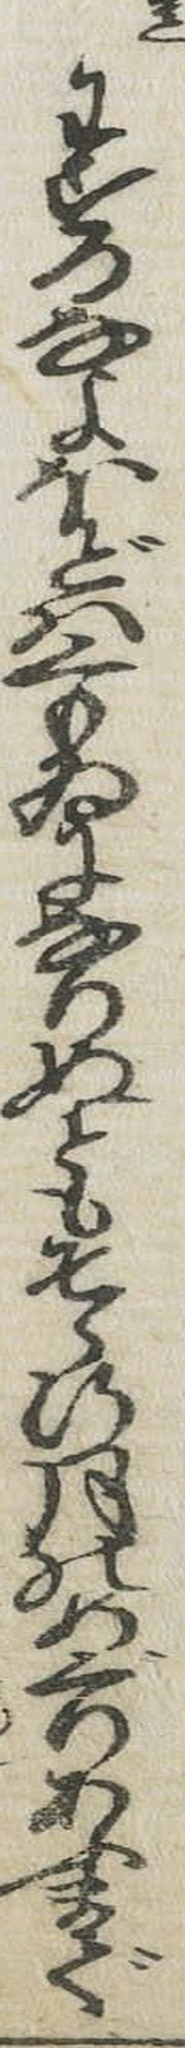わするなよほどはくもゐになりぬともそら行月のめぐりあふまで
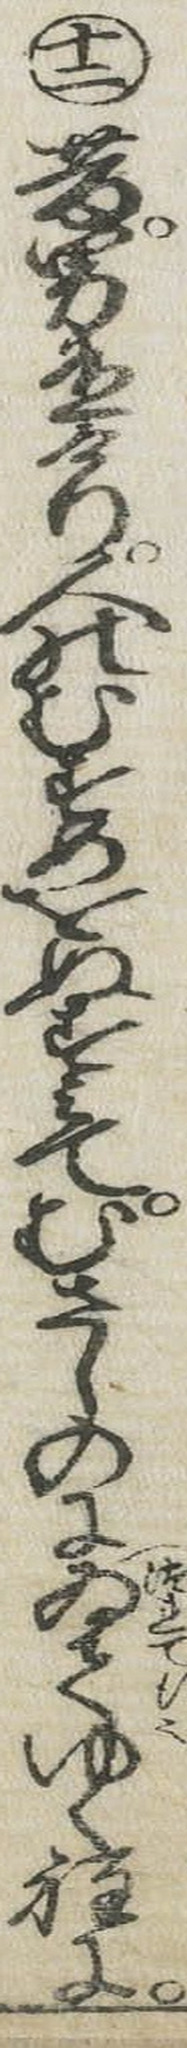(十二)昔。男有けり。人のむすめをぬすみて。むさしのにゐてゆく程に。
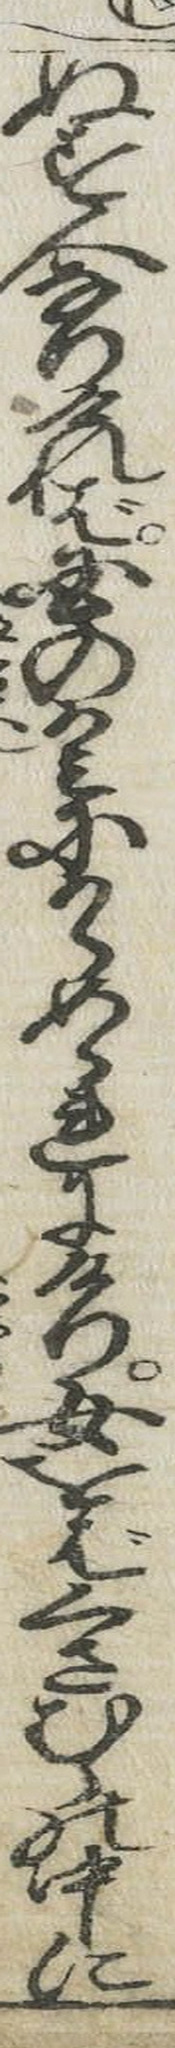ぬす人なりければ。国のかみにからめられにけり。女をばくさむらの中に
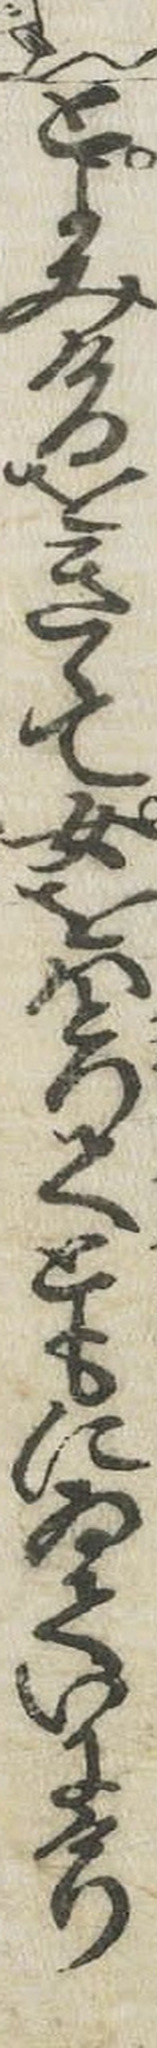と。よみけるをきゝて。女をはとりてともにゐていにけり
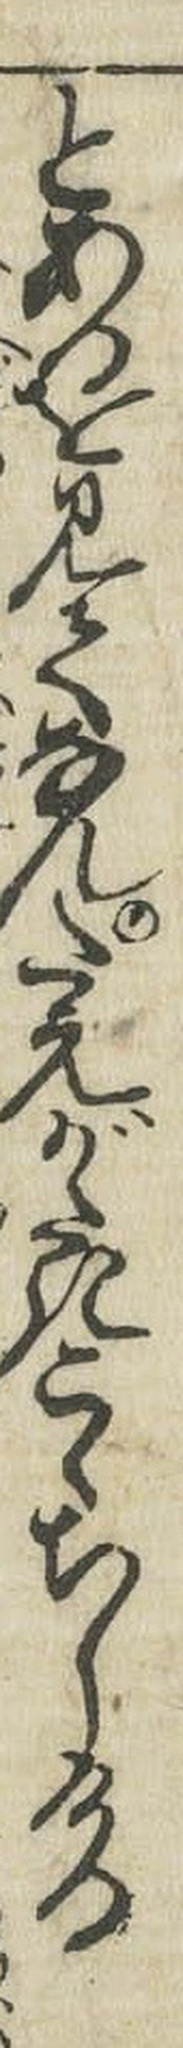とあるを見てなん。たえがたきこゝちしける
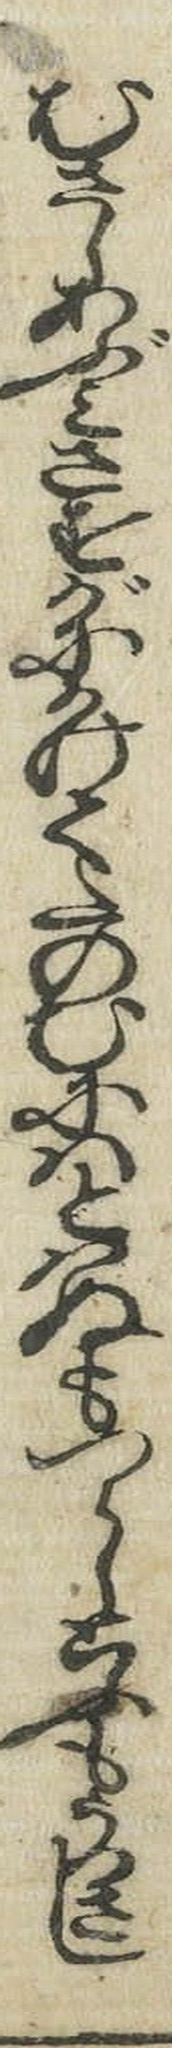むさしあぶみさすがにかけてたのむにはとはぬもつらしとふもうるさし
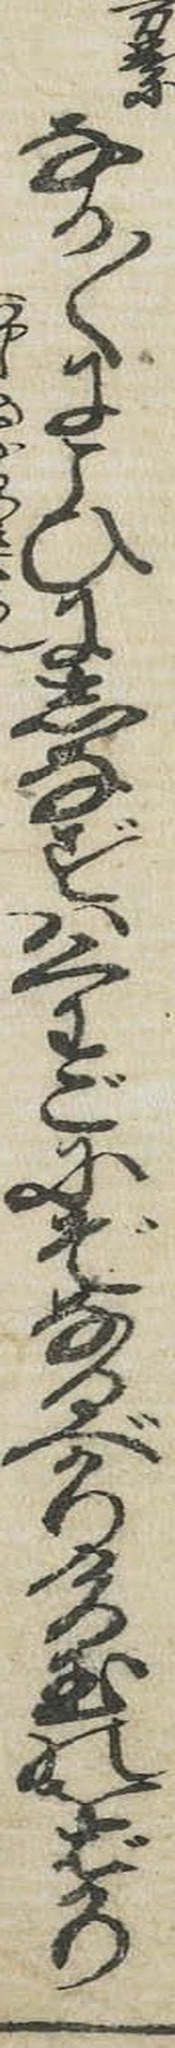なか〳〵にこひにしなずはくわごにぞなるべかりける玉のをばかり
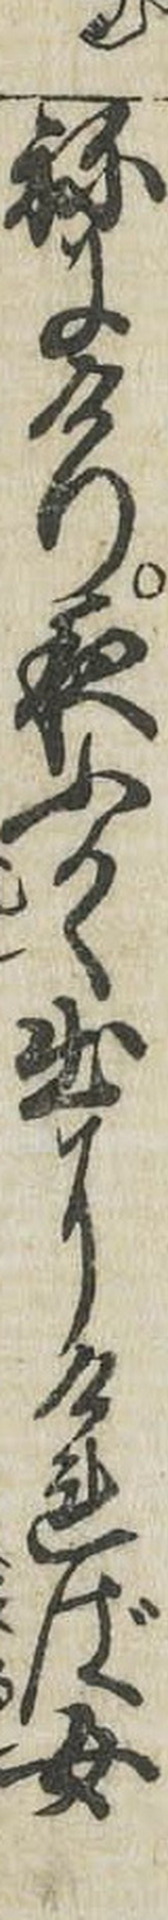ねにけり。夜ふかく出にければ女
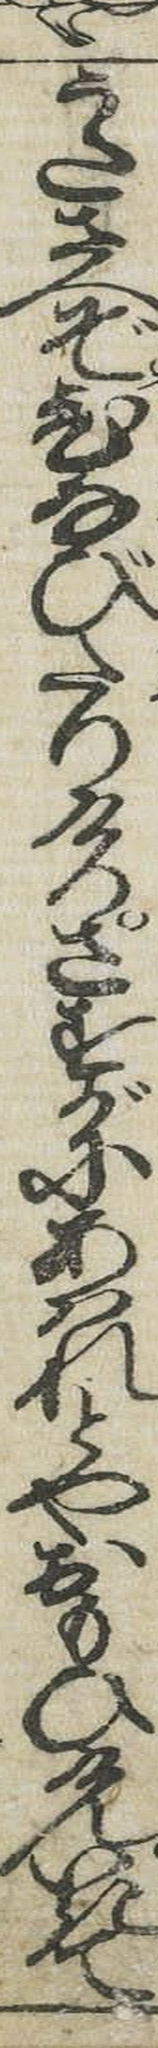うたさへぞ。ひなびたりける。さすがにあはれとやおもひけん。いきて
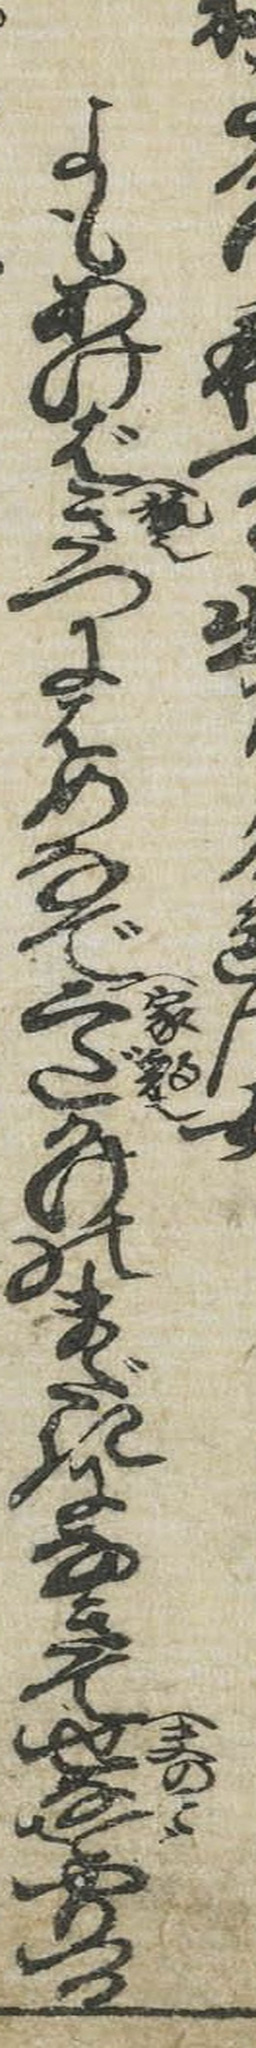よもあけばきつにはめなでくだかけのまだきになきてせなをやりつる
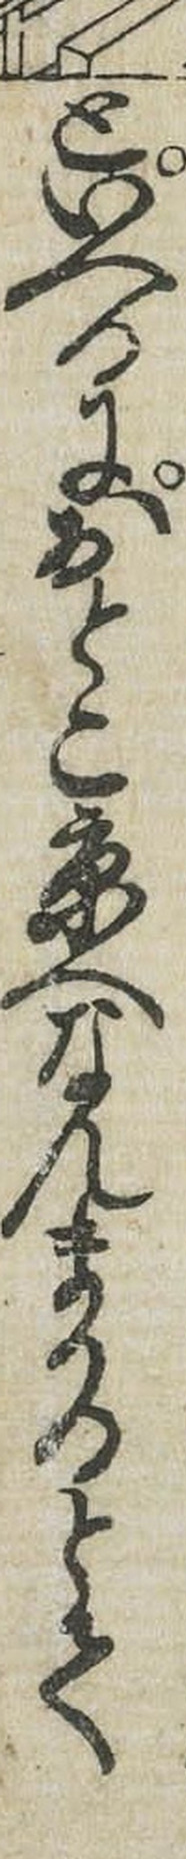と。いへるに。おとこ京へなんまかるとて
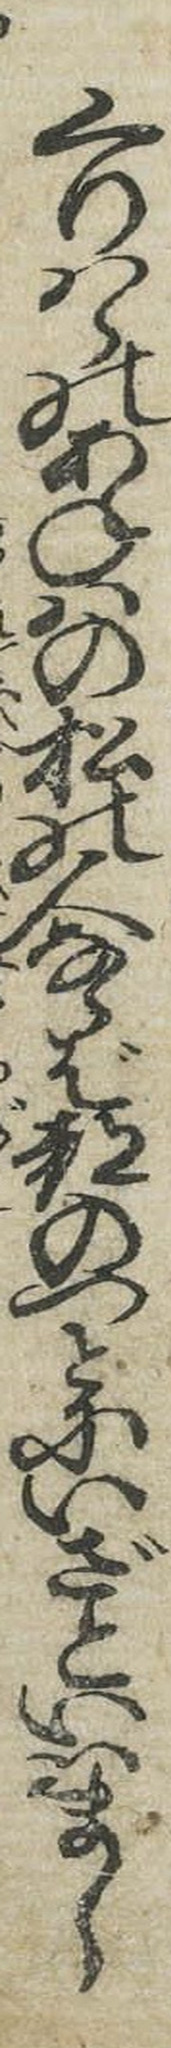くりはらのあねはの松の人ならば都のつとにいざといはまし
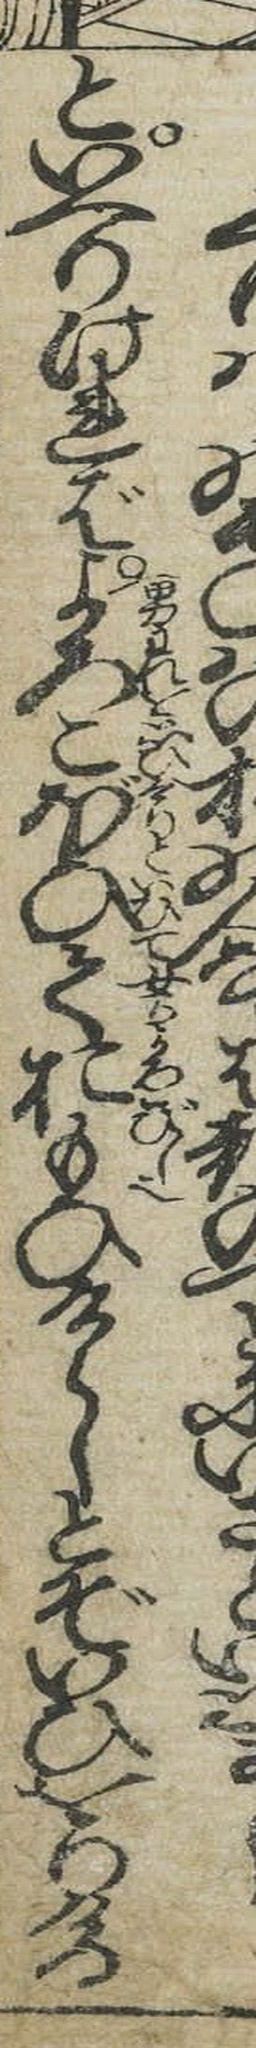と。いへりければ。よろこぼひておもひけらしとぞいひをりける

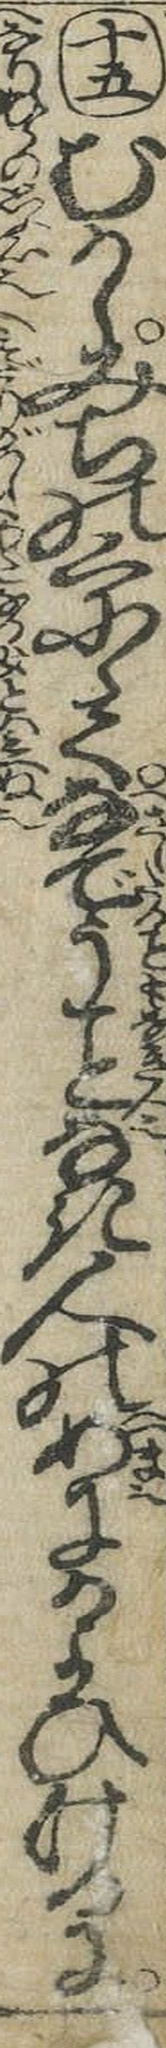(十五)むかし。みちのくにゝて。なでうことなき人のめにかよひけるに。
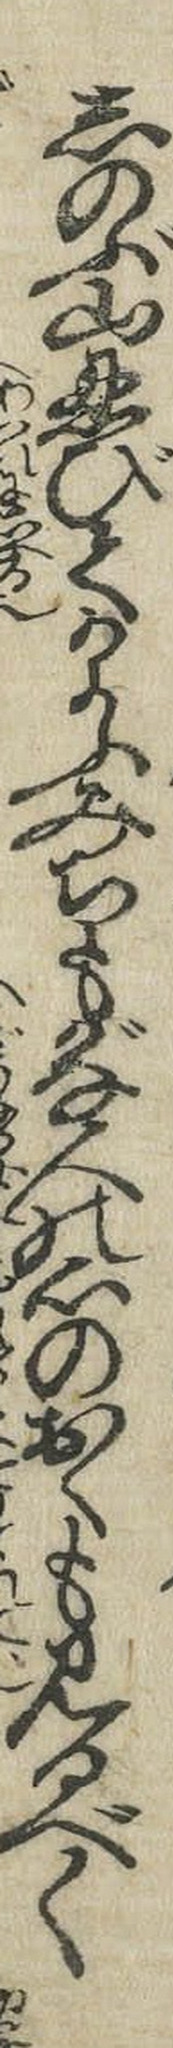しのぶ山忍びてかよふみちもがな人の心のおくも見るべく
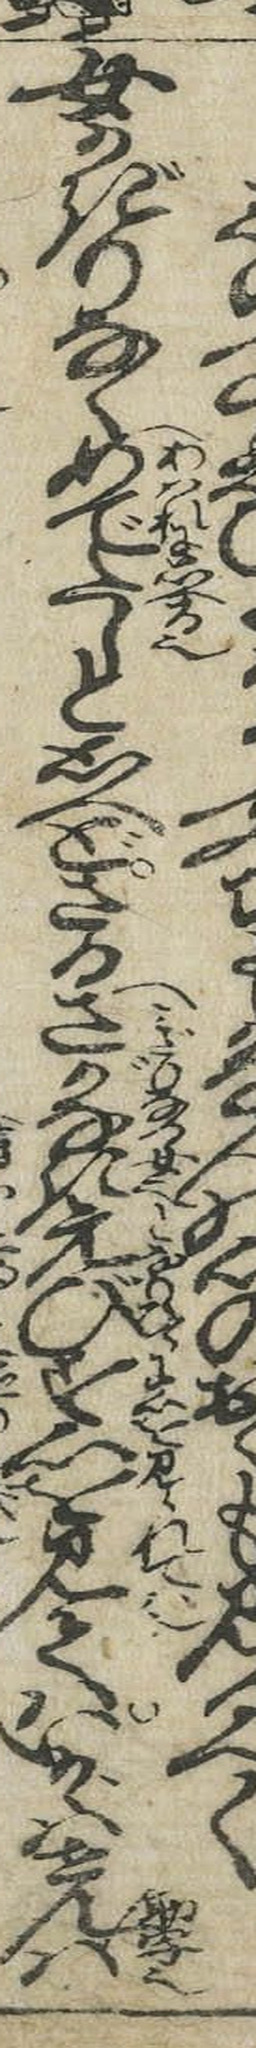女かぎりなくめでたしと思へど。さるさがなきえびす心を見ては。いかゞはせんは
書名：新板絵入伊勢物語 : かうしやく付 2巻 上
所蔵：東京学芸大学教育コンテンツアーカイブ
